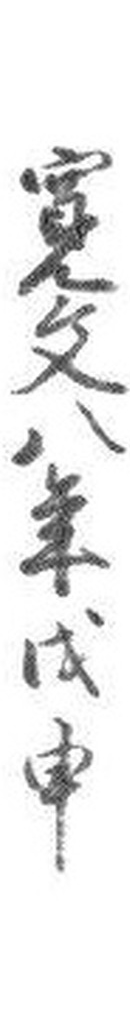寛文八年戊申
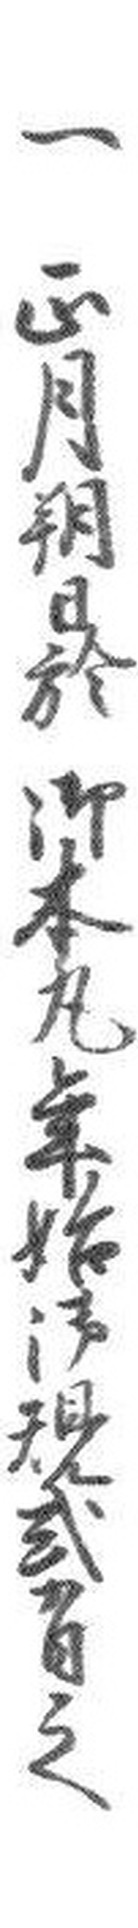一正月朔日於御本丸年始御規式有之
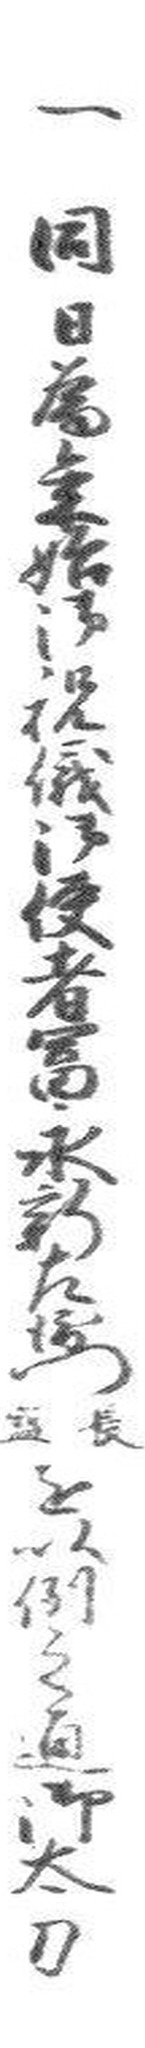一同日為年始御祝儀御使者冨永新左衛門長盛を以例之通御太刀
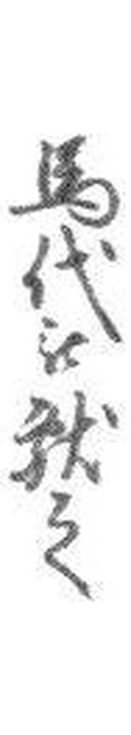馬代被献之
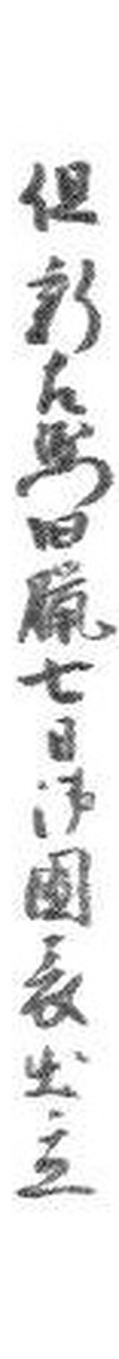但新左衛門旧臘七日御国表出立
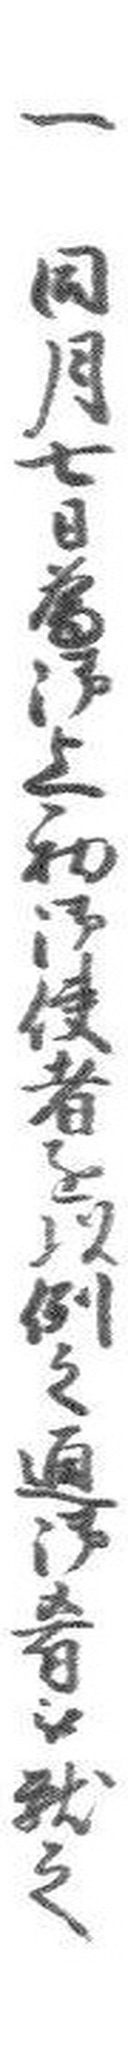一同月七日為御上初御使者を以例之通御肴被献之
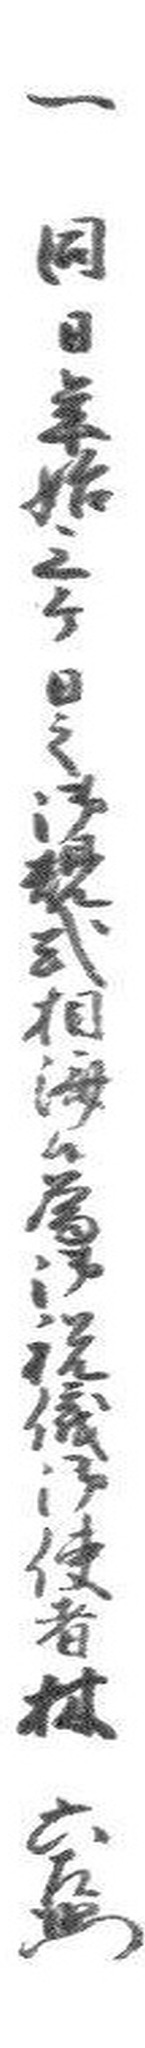一同日年始三ケ日之御規式相済候為御祝儀御使者林六左衛門

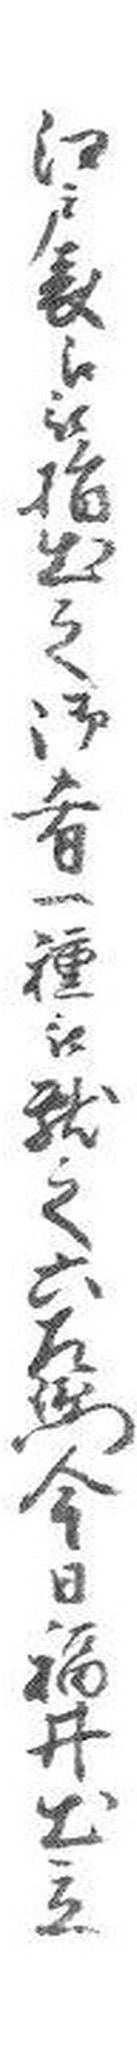江戸表江被指出之御肴一種被献之六左衛門今日福井出立
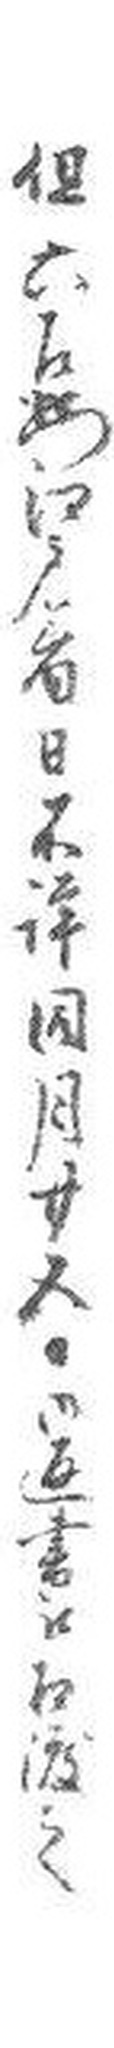但六左衛門江戸着日不詳同月廿五日御返書被相渡之
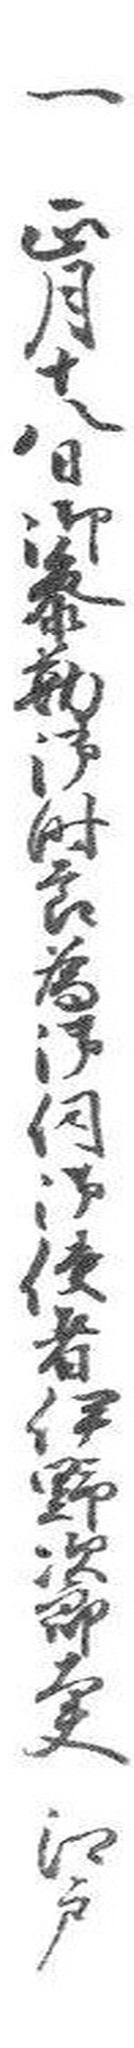一正月十八日御参勤御時節為御伺御使者伊野次郎大夫江戸
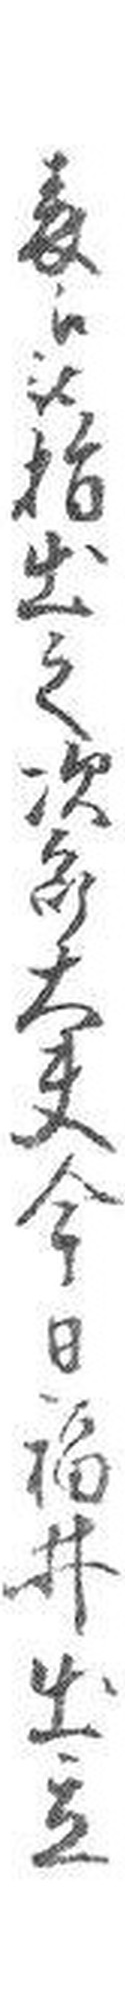表江被指出之次郎大夫今日福井出立
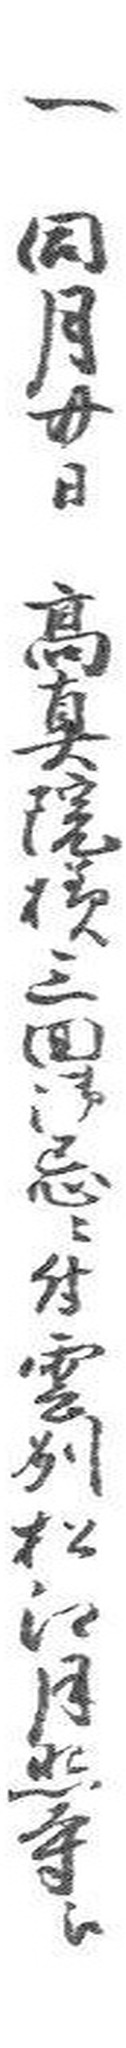一同月廿日高真院様三回御忌ニ付雲州松江月照寺江
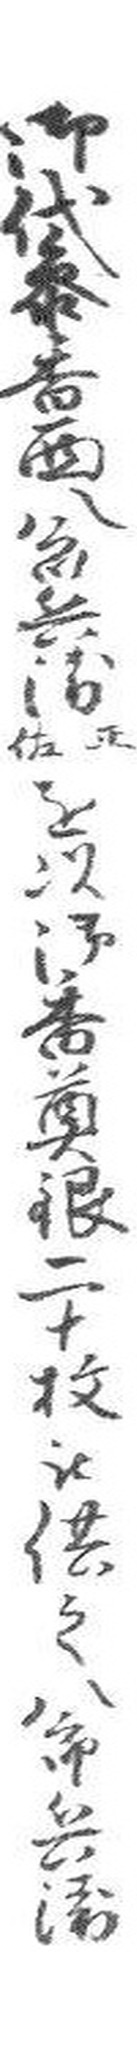御代参香西八郎兵衛正佐を以御香奠銀二十枚被供之八郎兵衛
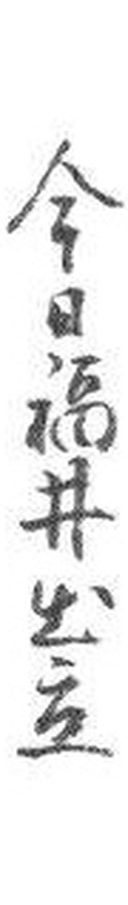今日福井出立
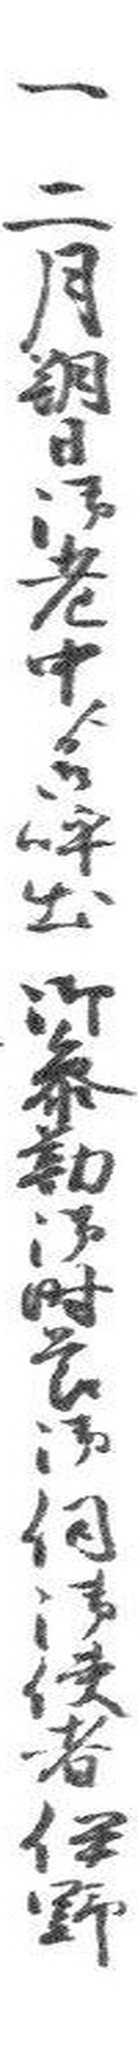一二月朔日御老中ゟ御呼出御参勤御時節御伺御使者伊野
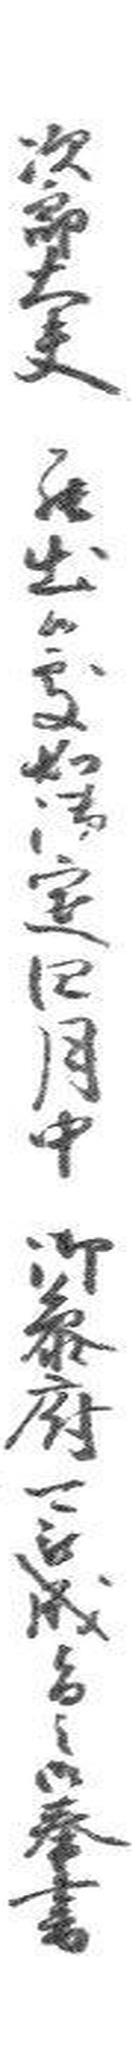次郎大夫罷出候処如御定四月中御参府可被成旨之御奉書
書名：家譜 七 光通公 従寛文四年到同九年
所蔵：福井県文書館 Fukui Prefectural Archives
